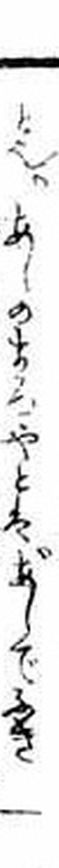と也あしのまろやとはあしでふき
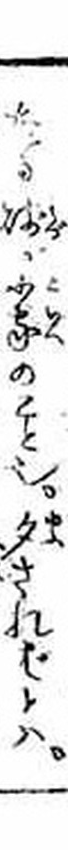たる賎が小家のこと也夕さればとは信
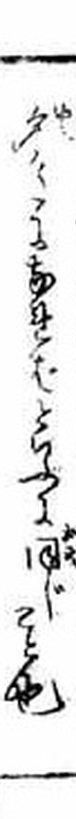夕かたになればといふに同じこと也

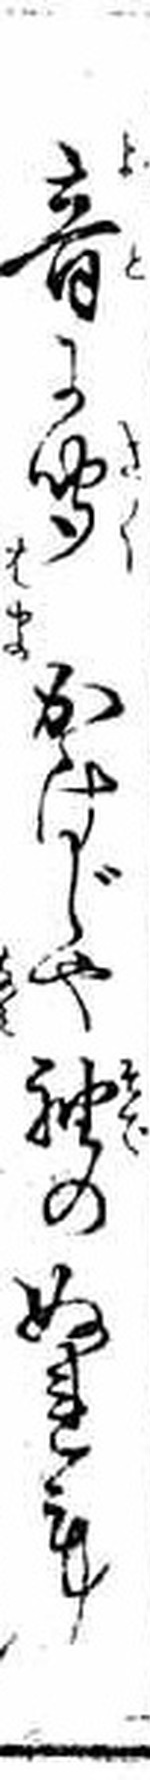音に聞かけじや袖のぬれも
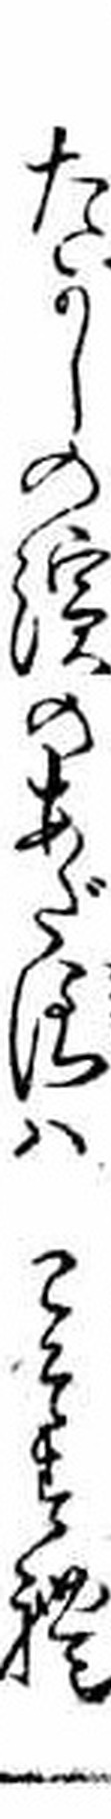たかしの浜のあだ波はこそすれ
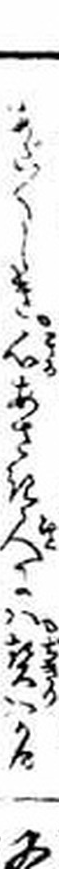あだ〳〵しき心あさき人には契祐子
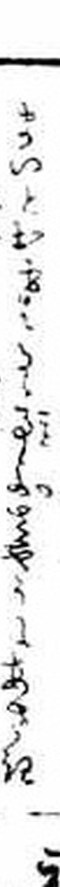るまいとおもはるゝ事よさやうにあさき
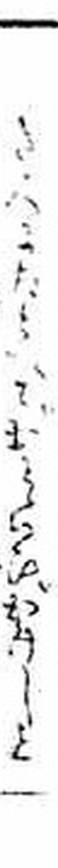き人にたとへておとゝにいひしかけしと
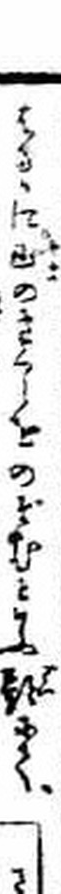はるに山のさくらをのぞむといふ題にて
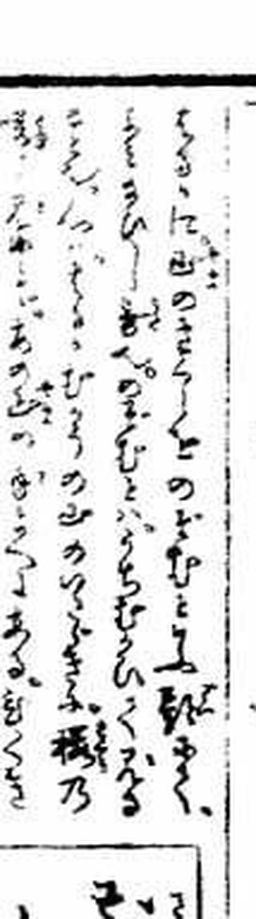よみ給ひし哥也のぞむとはうち向ひてみる前
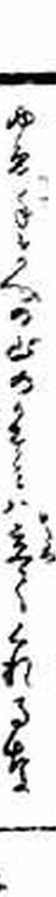ゆゑ手まへの山のかすみは立てくれるな
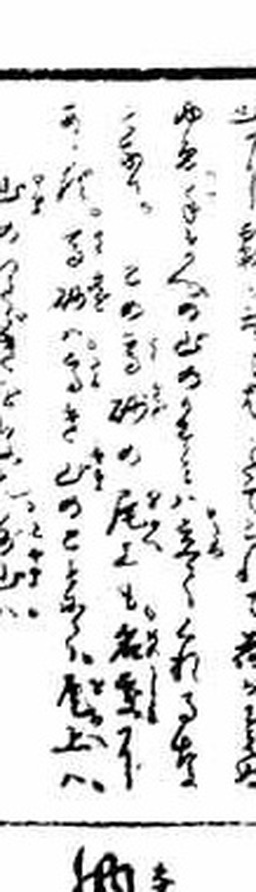となりこの高砂の尾上も名所に納言
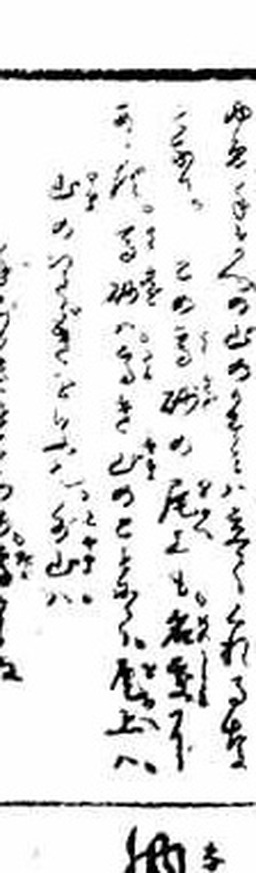あらず高砂は高き山のことにて尾上は
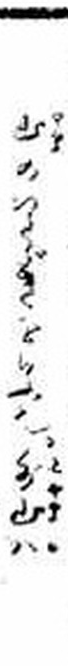山のいたゞきをいふ也外山は匡
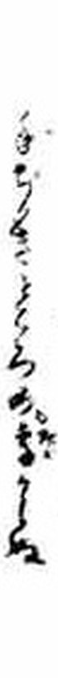手ぢかきところの高からぬ

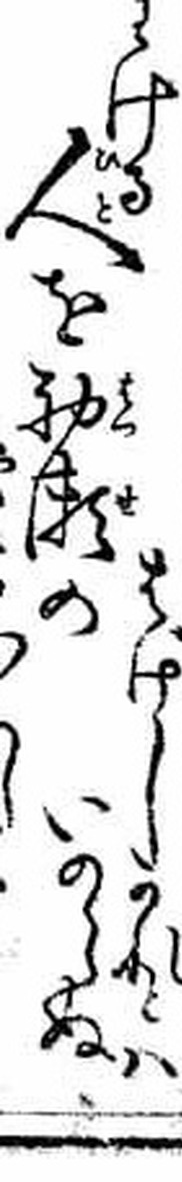人を初瀬のいのらぬ
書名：小倉百人一首
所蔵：東京学芸大学教育コンテンツアーカイブ
